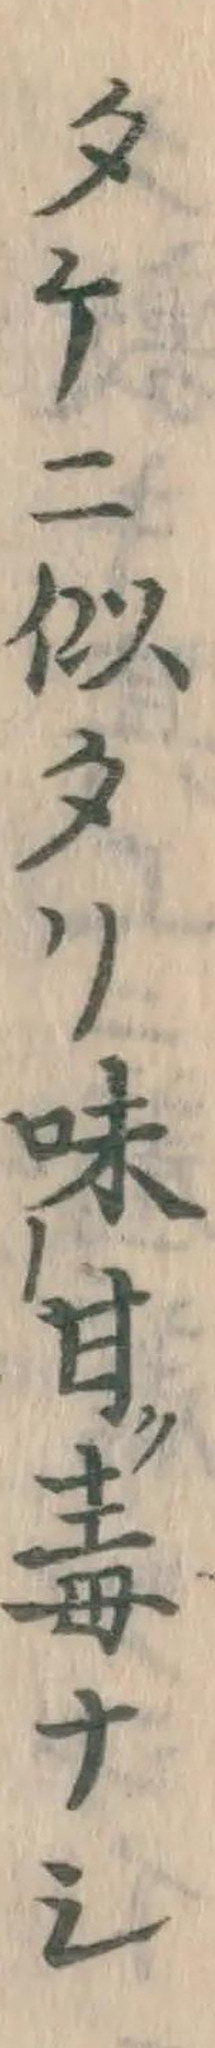タケニ似タリ味甘毒ナシ
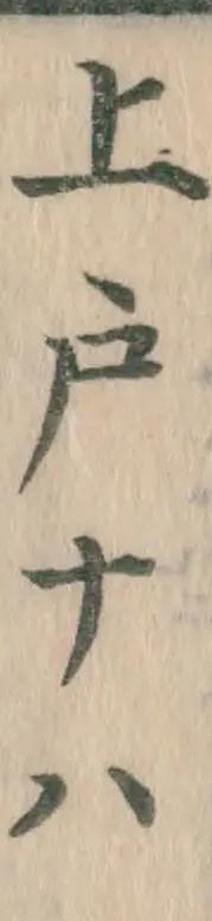上戸ナハ
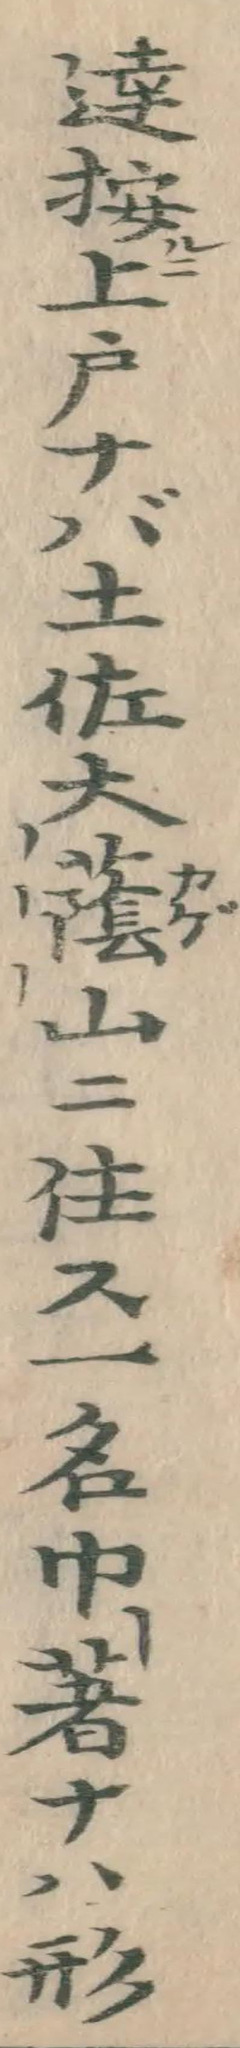達按上戸ナバ土佐大蔭山ニ住ス一名巾著ナハ形
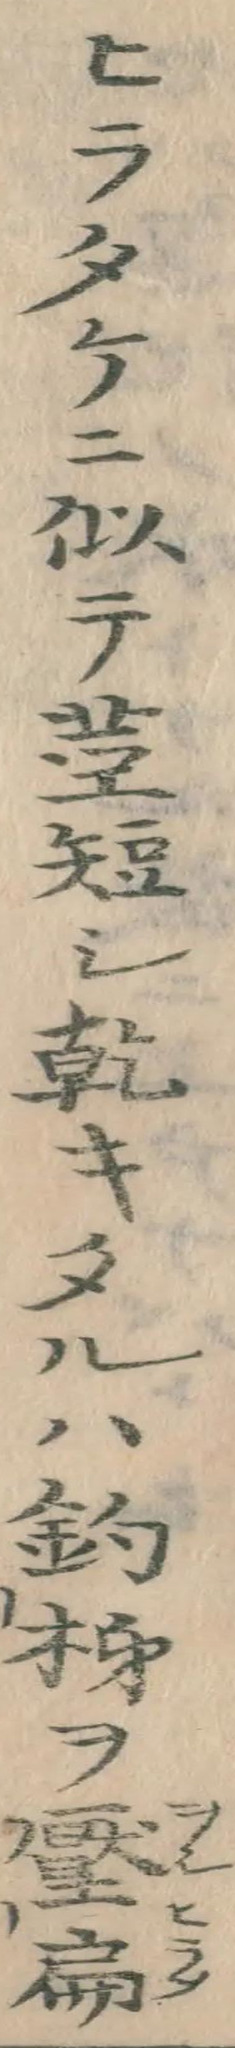ヒラタケニ似テ茎短シ乾キタルハ釣柿ヲ壓扁
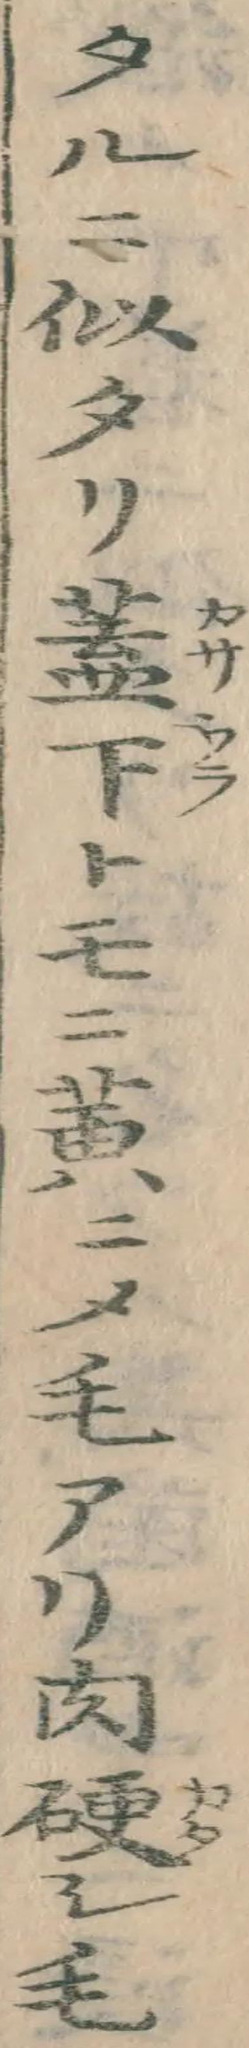タルニ似タリ葢下トモニ黄ニシテ毛アリ肉硬シ毛

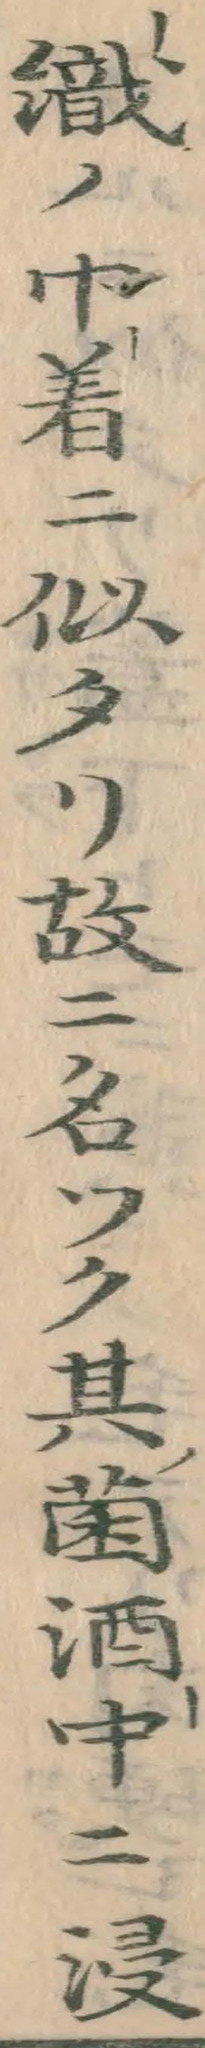織ノ巾着ニ似タリ故ニ名ツク其菌酒中ニ浸
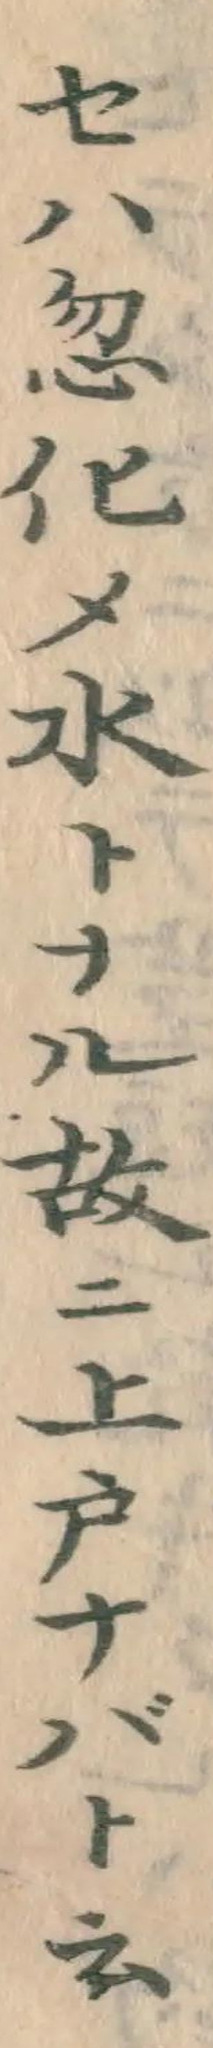セハ忽化シテ水トナル故ニ上戸ナバト云
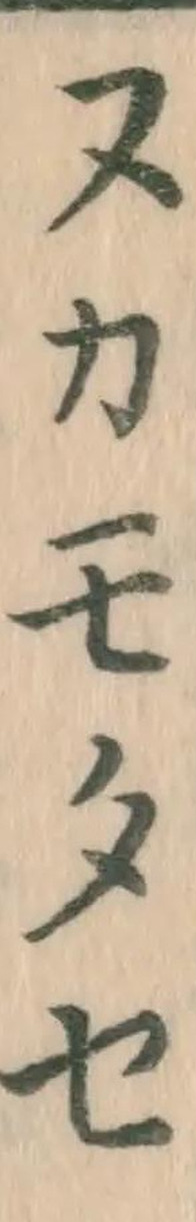ヌカモタセ
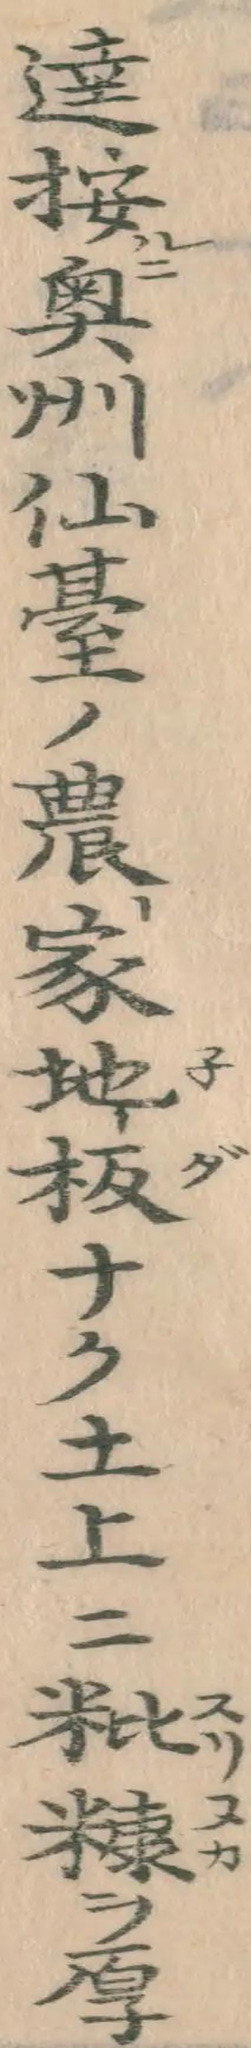達按奥州仙台ノ農家地板ナク土上ニ粃糠ヲ厚
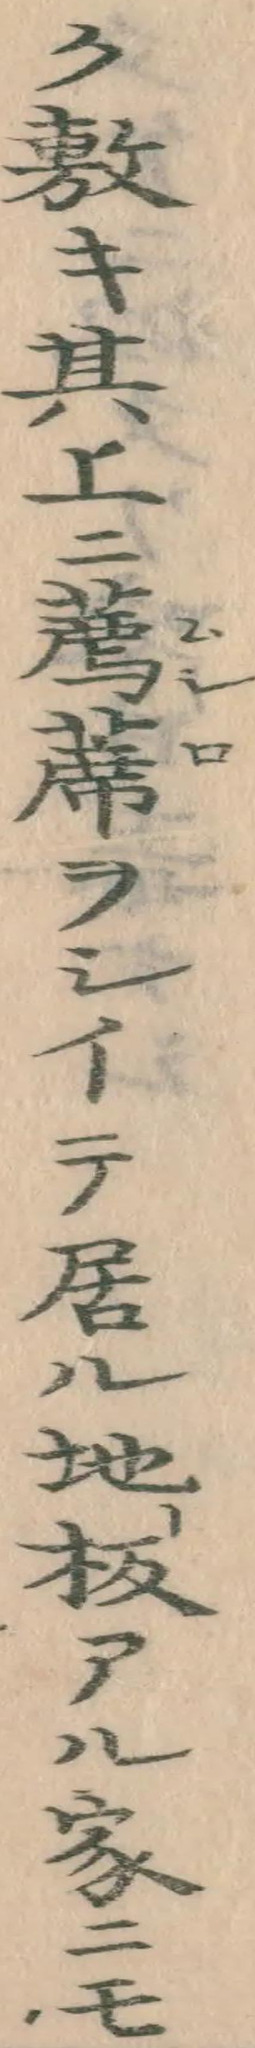ク敷キ其上ニ薦蓆ヲシイテ居ル地板アル家ニモ
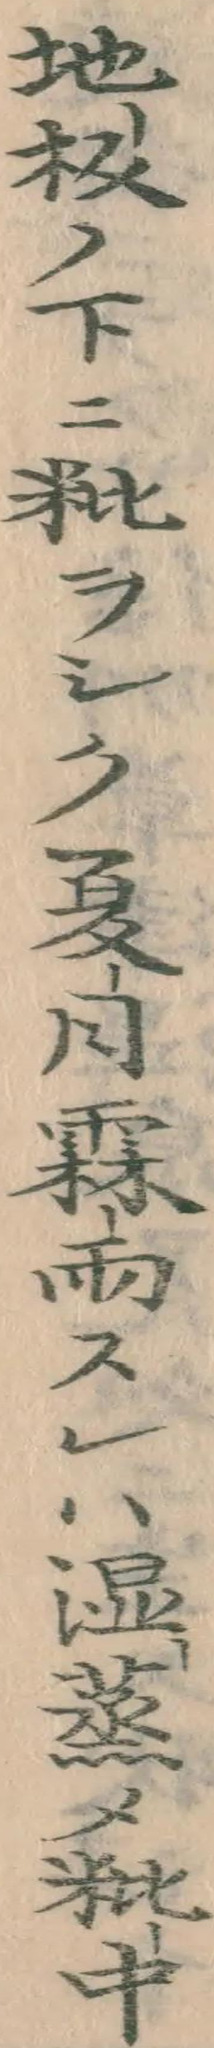地板ノ下ニ粃ヲシク夏月霖雨スレハ湿蒸シテ粃中
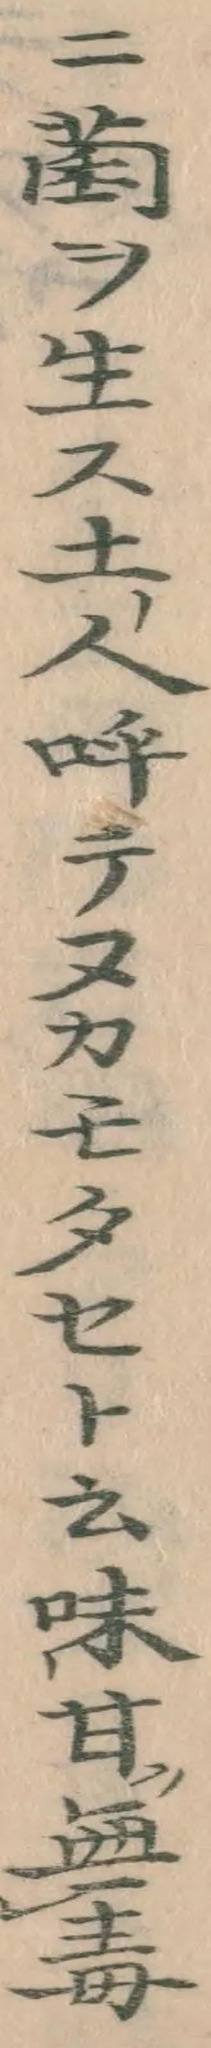ニ菌ヲ生ス土人呼テヌカモタセト云味甘無毒
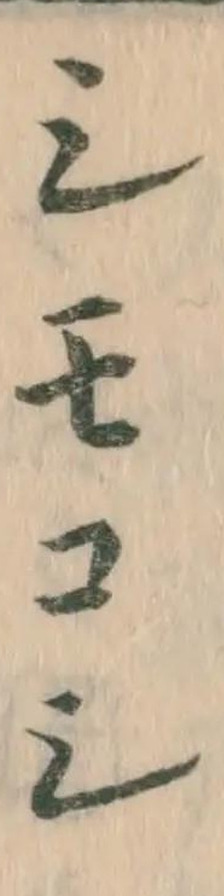シモコシ
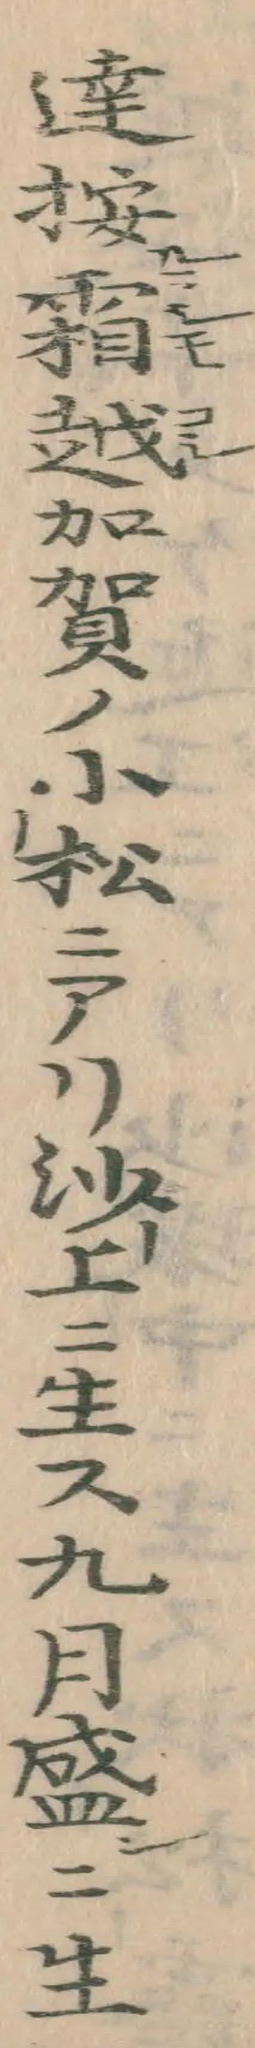達按霜越加賀ノ小松ニアリ沙上ニ生ス九月盛ニ生
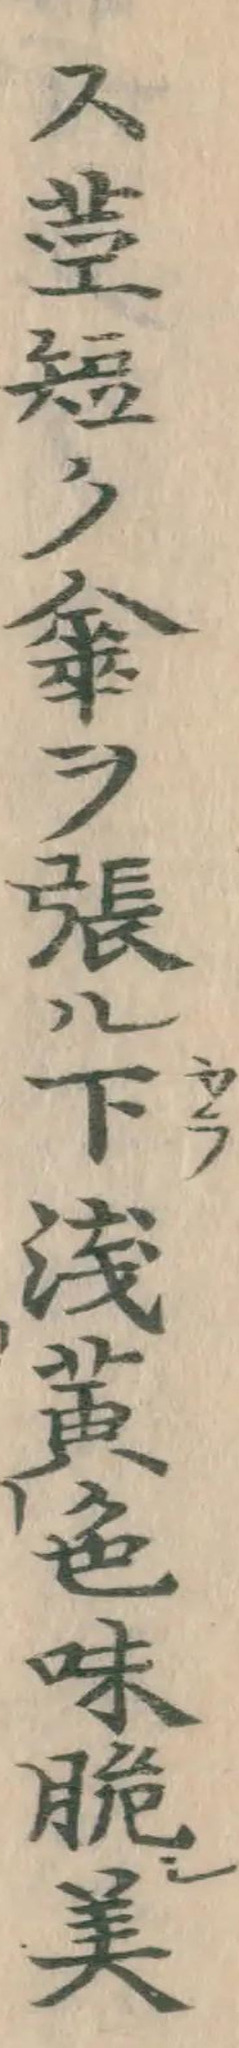ス茎短ク傘ヲ張ル下浅黄色味脆美
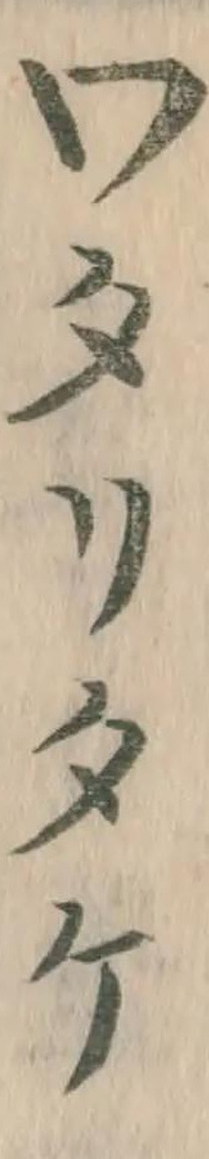ワタリタケ
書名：怡顔斎菌品 2巻
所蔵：国立国会図書館 National Diet Library, JAPAN
